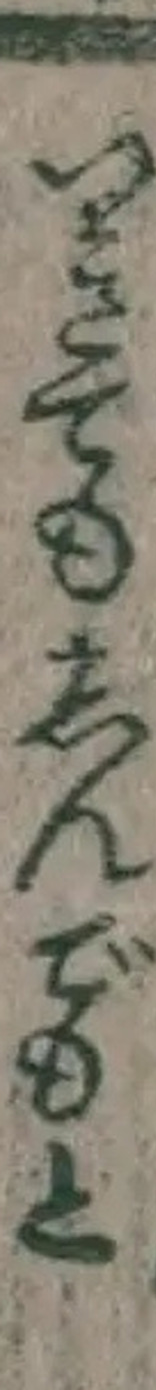いきてもしんでもと
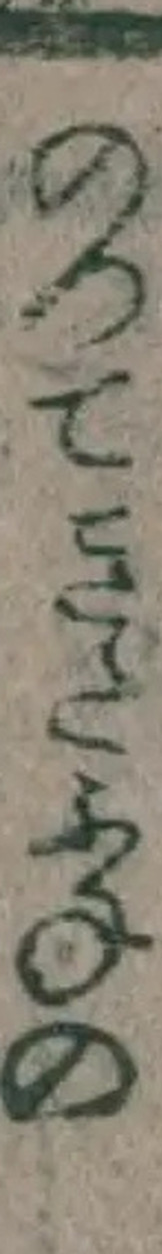のつてきたふねの
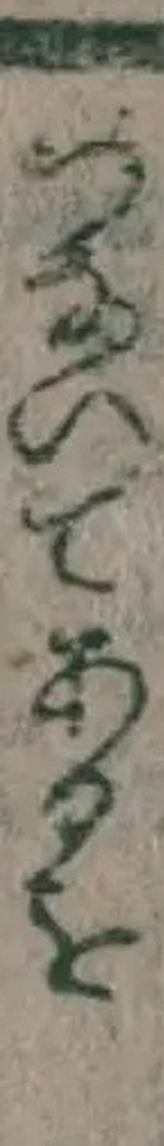つないてあるを
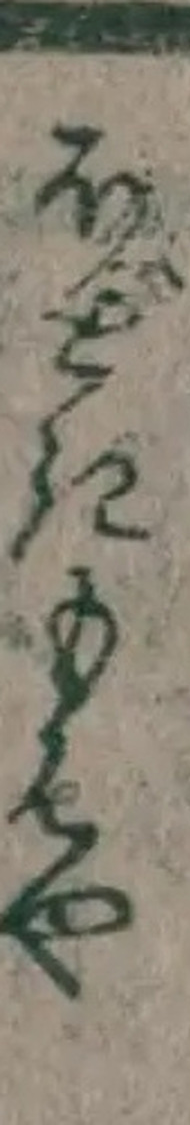ほどきもはや
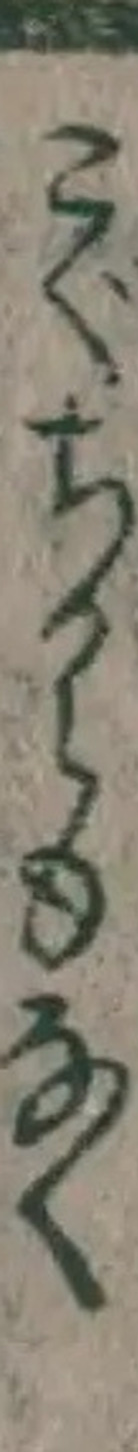こぐちからもなく
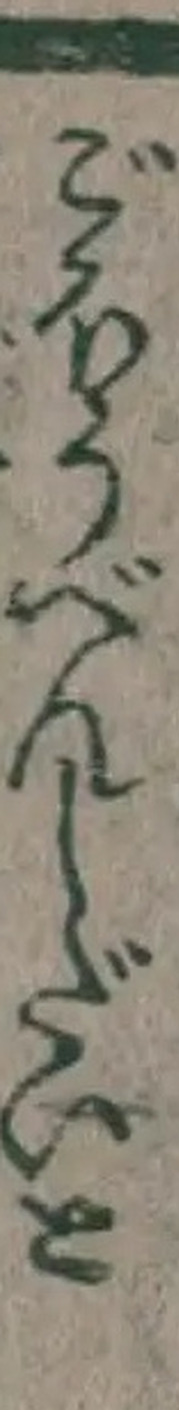ごほうべんしだいと
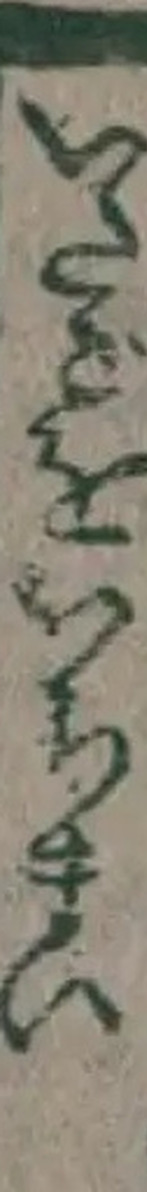いたごをいちまい
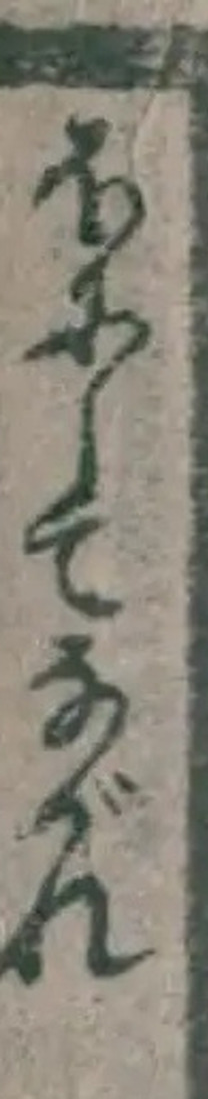ほにしてながれ
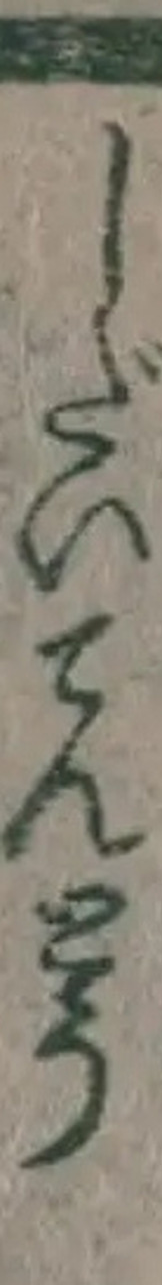しだいてんとう
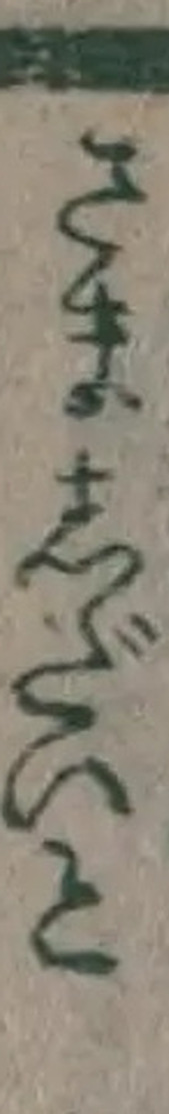さましだいと
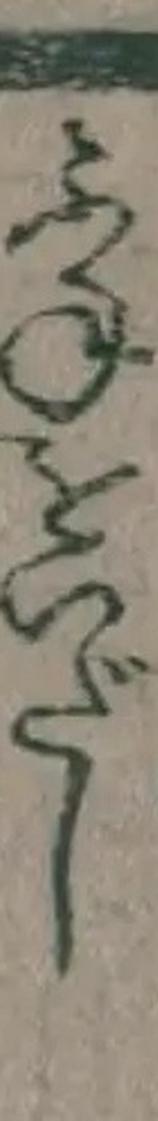ふねをいだし
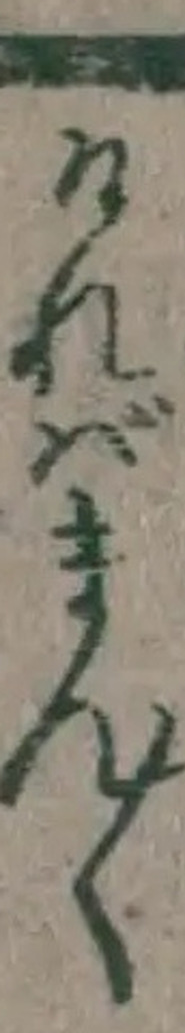ければまん〳〵
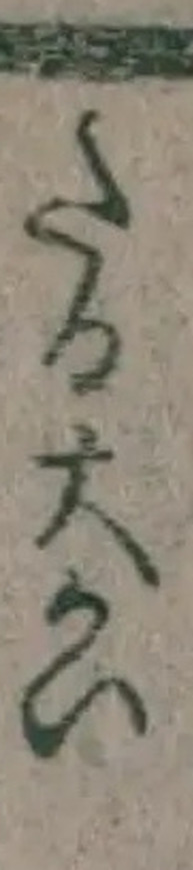たる大かい
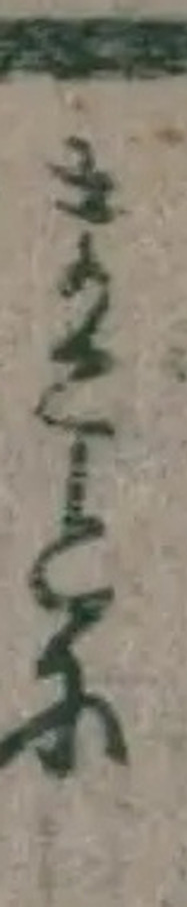まことに
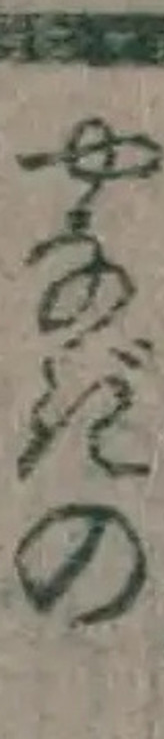やなぎの
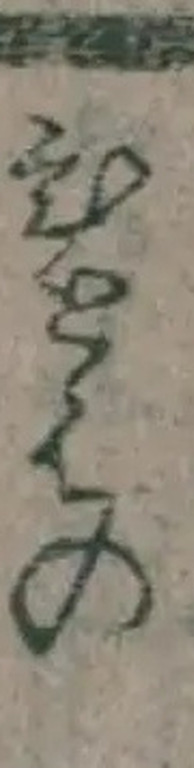ひとはの
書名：縦筒放唐の噺 3巻
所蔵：国立国会図書館 National Diet Library, JAPAN
